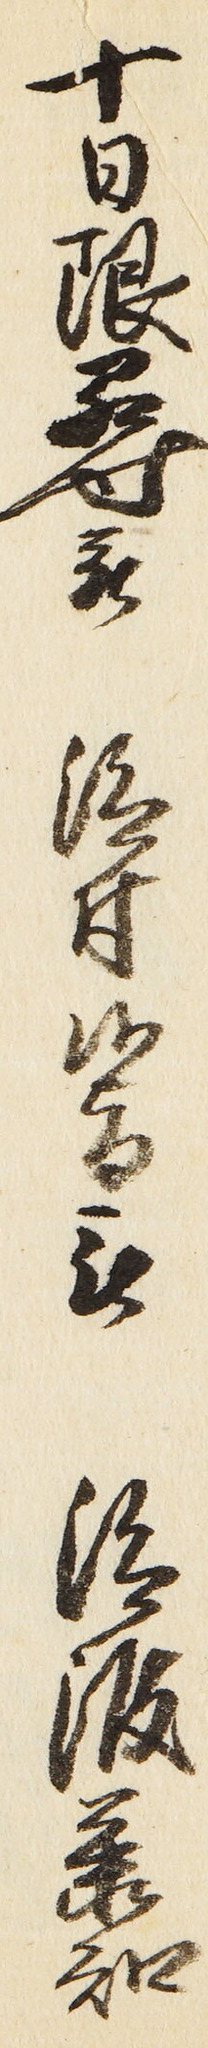十日限尋被仰付候旨被仰渡承知
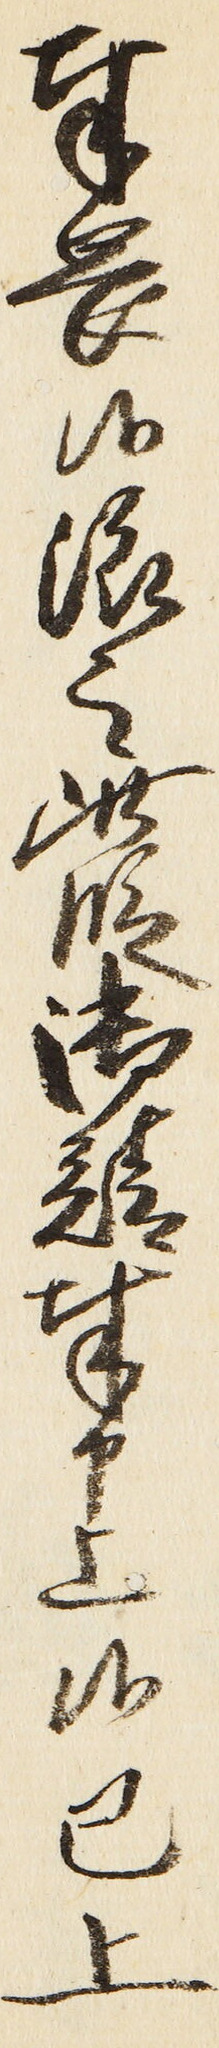奉畏候依之此段御請奉申上候已上
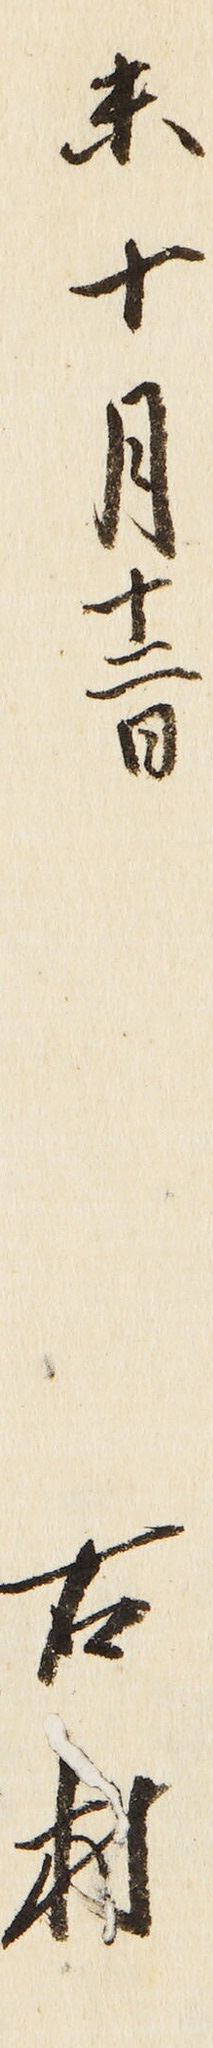未十月十二日右村
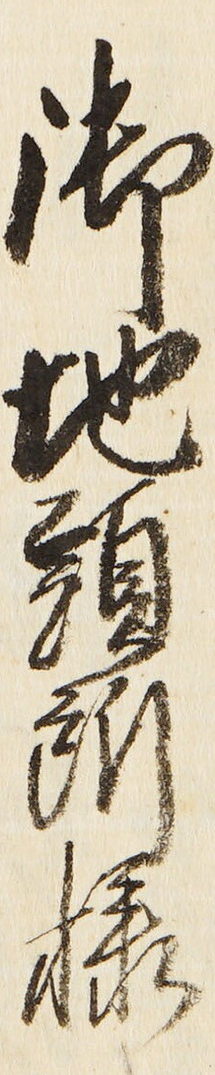御地頭所様
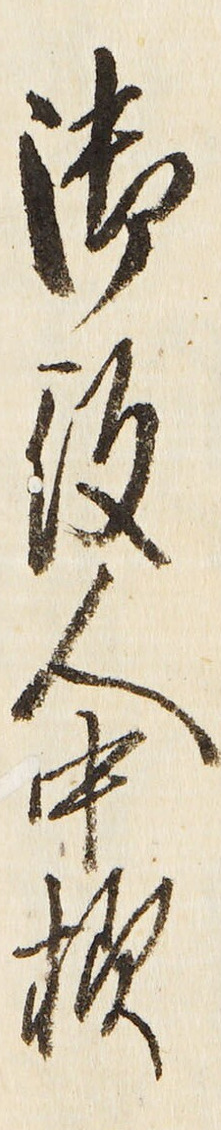御役人中様
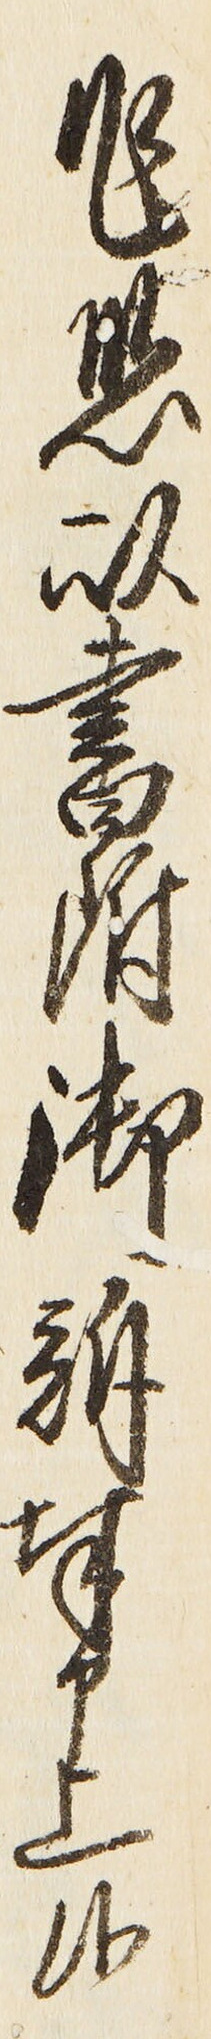乍恐以書付御訴奉申上候
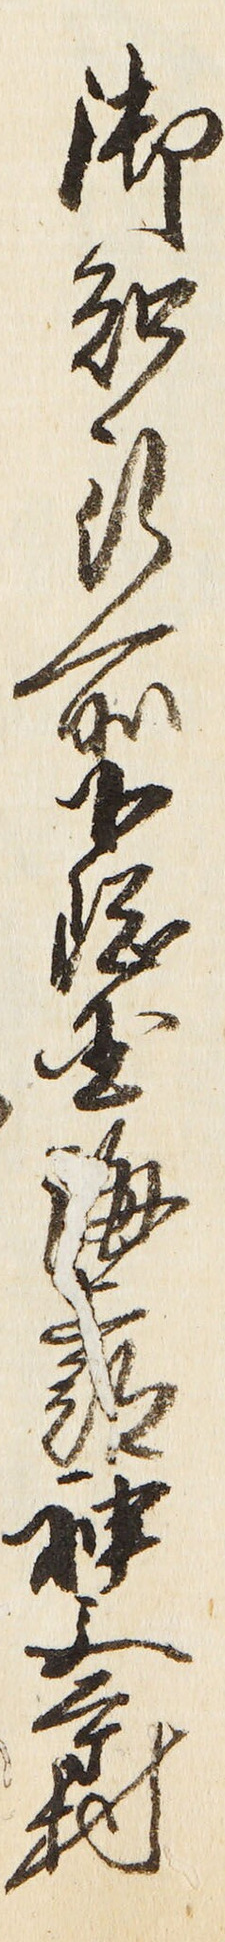御知行所下総国海上郡神宮寺村
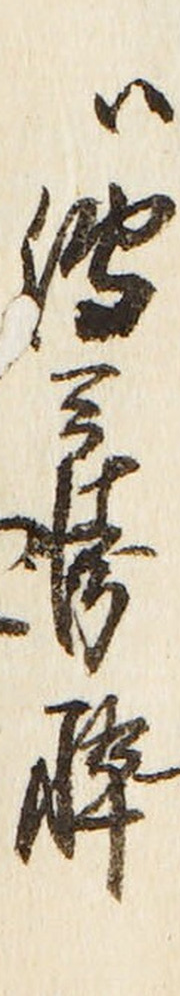同伝兵衛忰
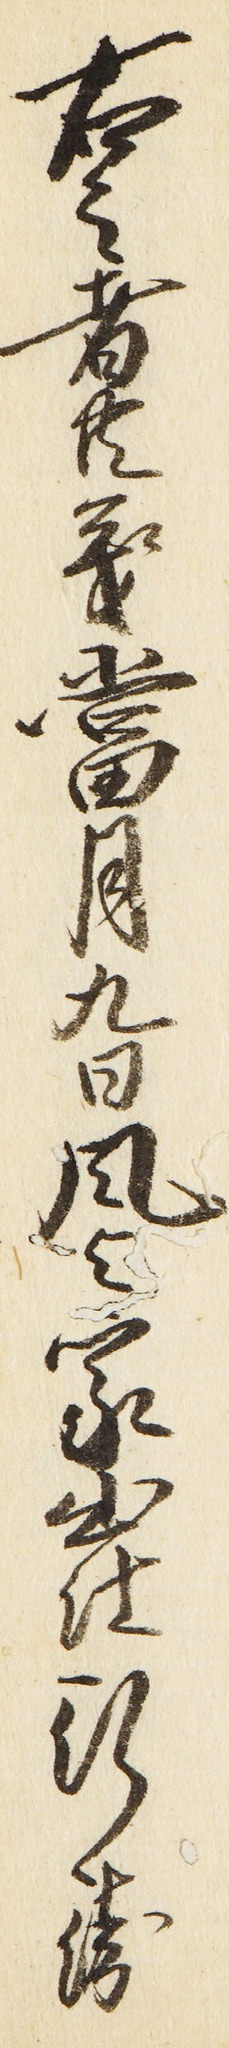右之者共義当月九日風与家出仕行衛

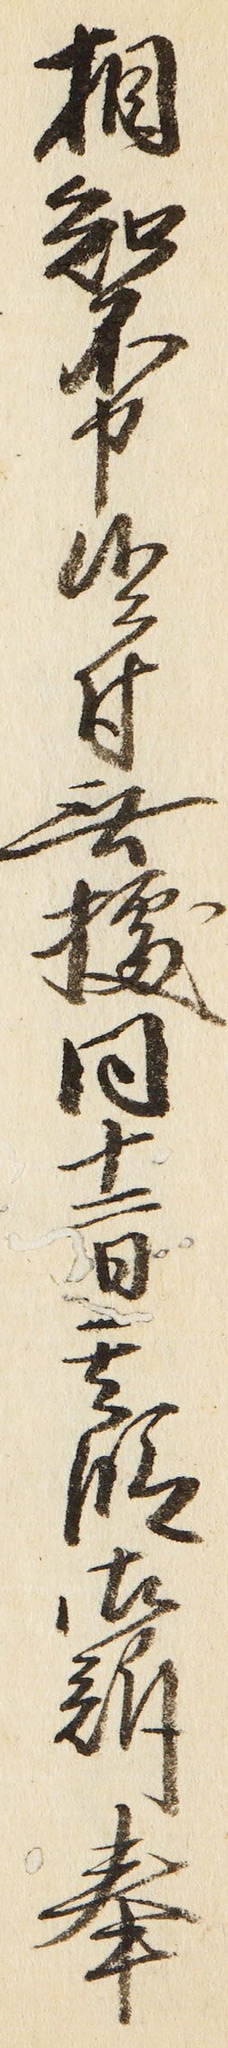相知不申候ニ付無拠同十二日其段御訴奉
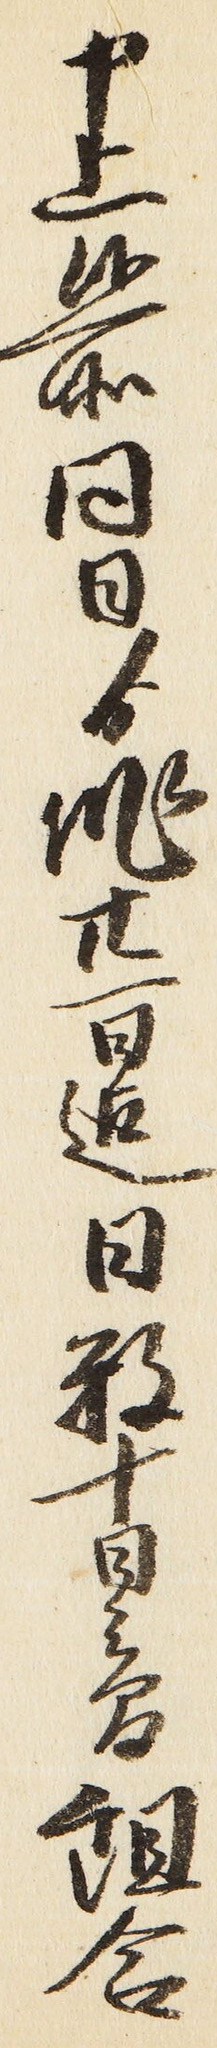申上候所同日ゟ昨廿一日迄日数十日之間組合
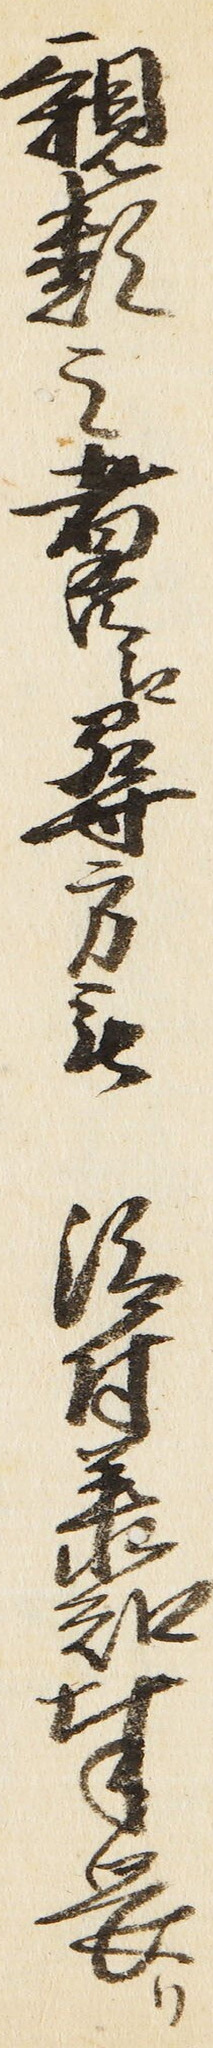親類之者共江尋方被仰付承知奉畏り
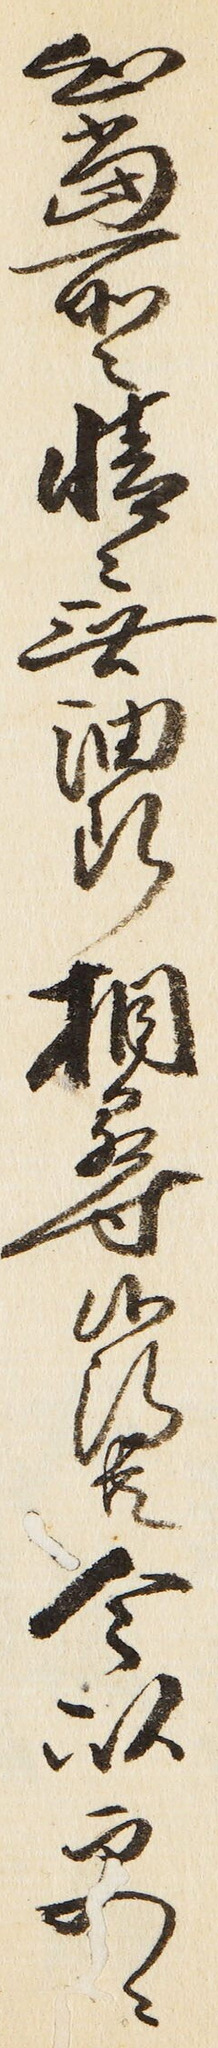心当所々情々無油断相尋候得共今以更ニ
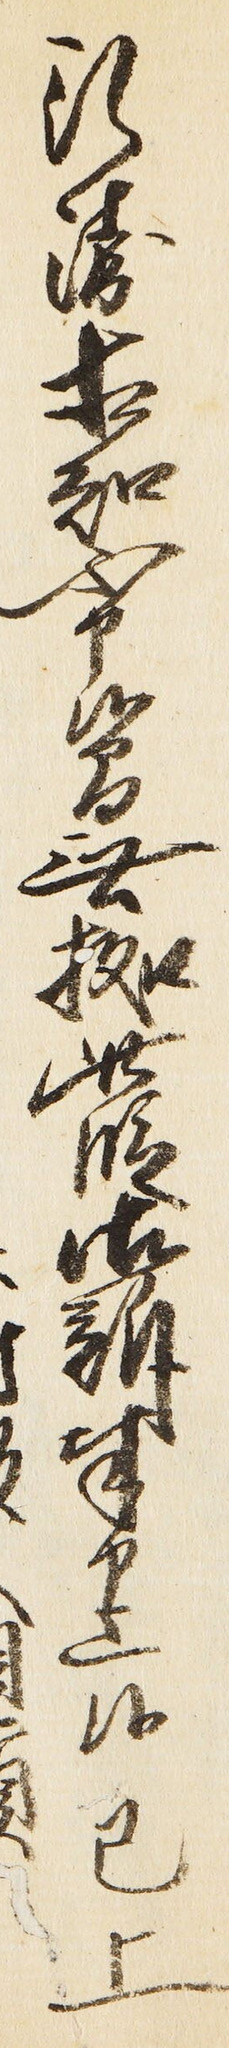行衛相不申候間無拠此段御訴奉申上候已上
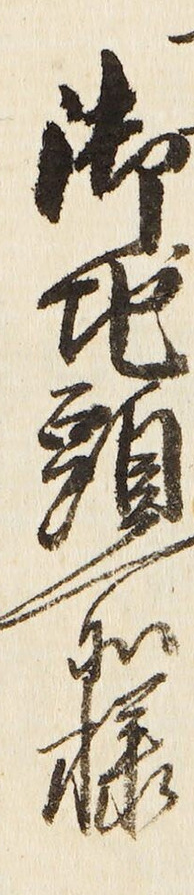御地頭所様
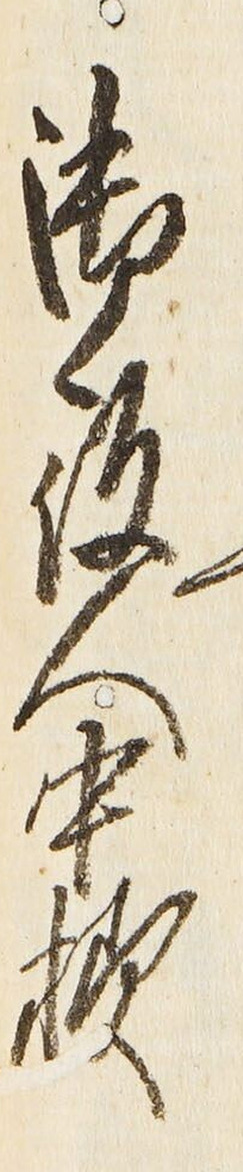御役人中様
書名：難船一件記録
